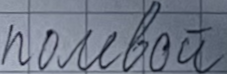полевой
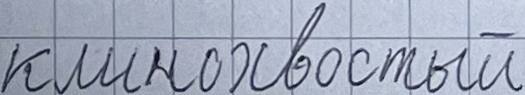клинохвостый
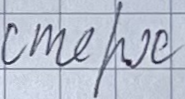стерх
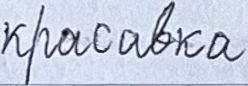красавка
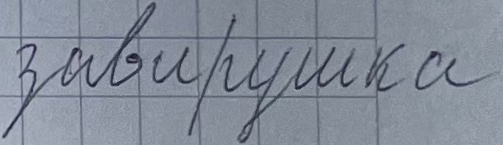завирушка
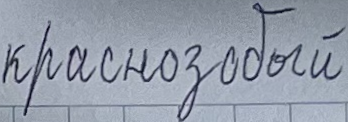краснозобый
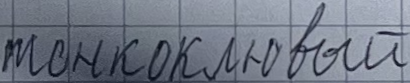тонкоклювый
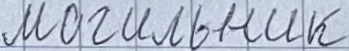могильник
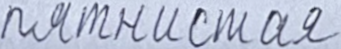пятнистая
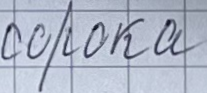сорока
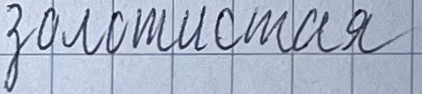золотистая
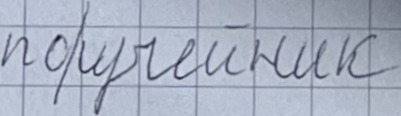поручейник
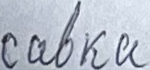савка
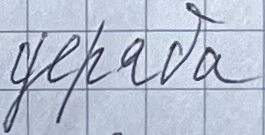деряба
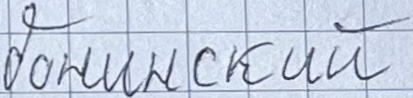бонинский
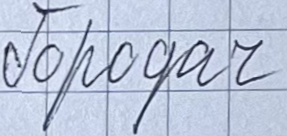бородач
